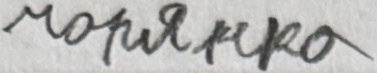морянка
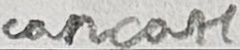сапсан
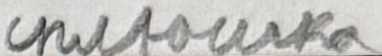сплюшка
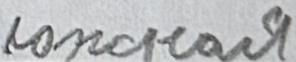южная
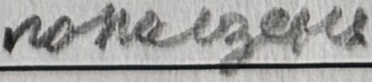поползень
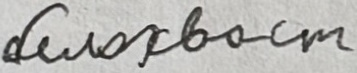белохвост
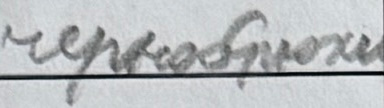чернобрюхи
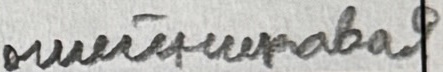ошейникавая
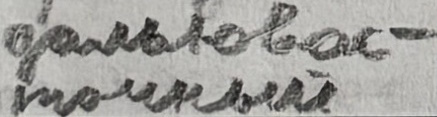дальювос-точный
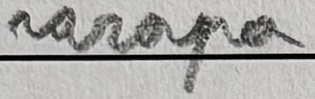гагара
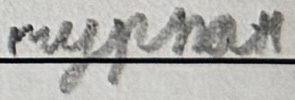турпан
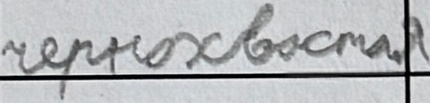чернохвостая
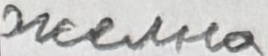желна
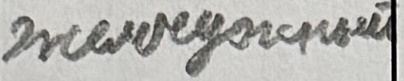жемчужный
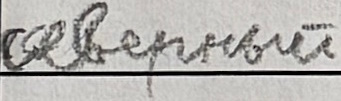северный
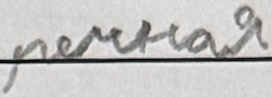речная
